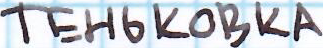теньковка
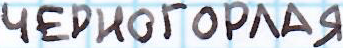черногорлая
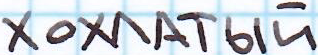хохлатый
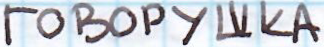говорушка
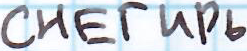снегирь
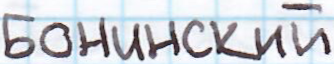бонинский
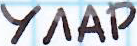улар
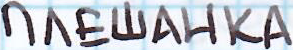плешанка
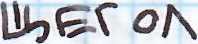щегол
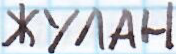жулан
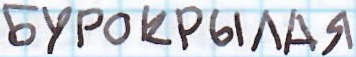бурокрылая
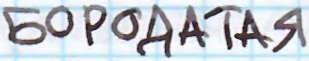бородатая
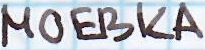моевка
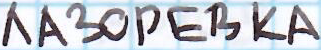лазоревка
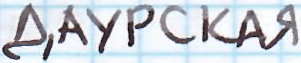даурская
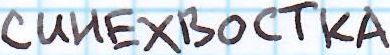синехвостка
